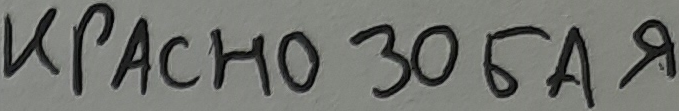красно зобая
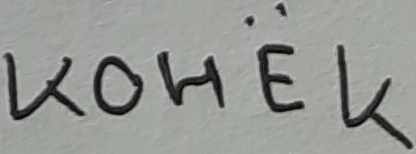конёк
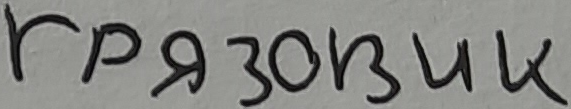грязовик
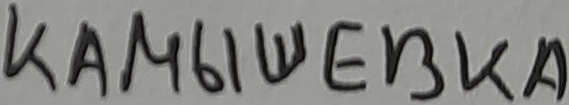камышевка
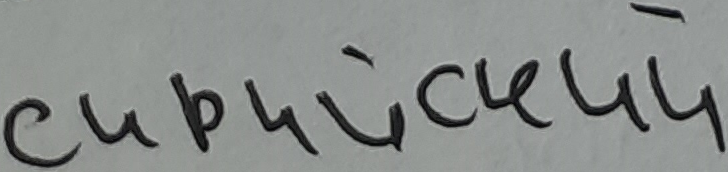сирийский
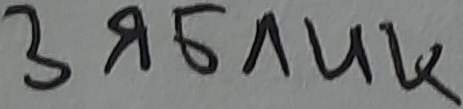зяблик
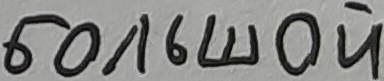большой
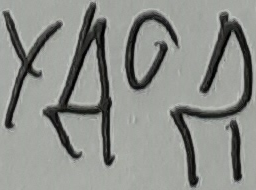удод
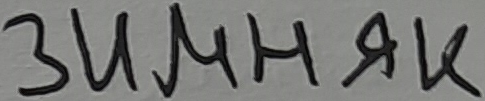зимняк
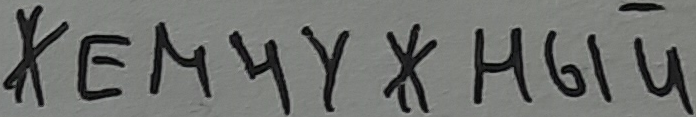жемчужный
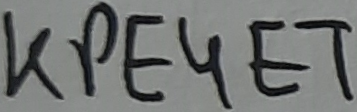кречет
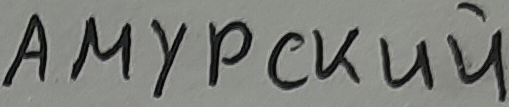амурский
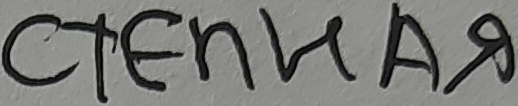степная
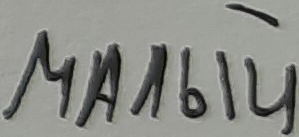малый
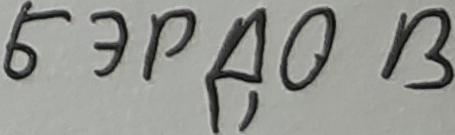бэрдов
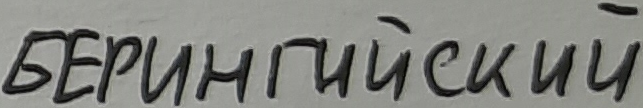берингийский
